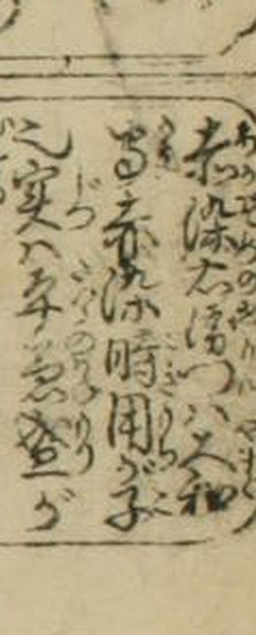守赤染時用が子
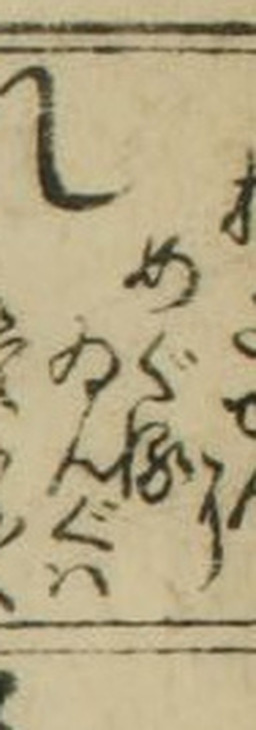ゐんぐは
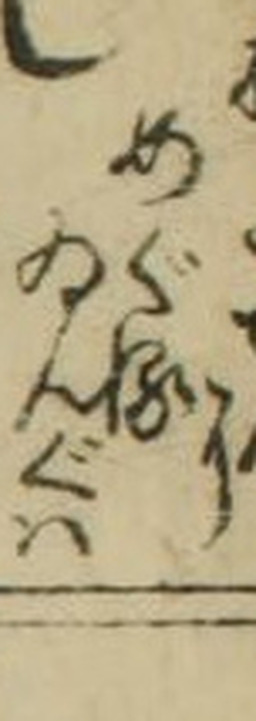ゐんぐは
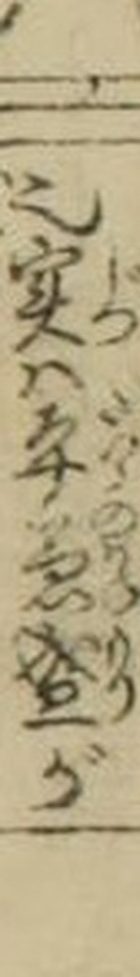也実は平兼盛が
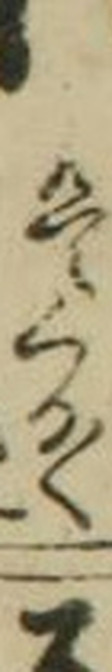はくる〳〵
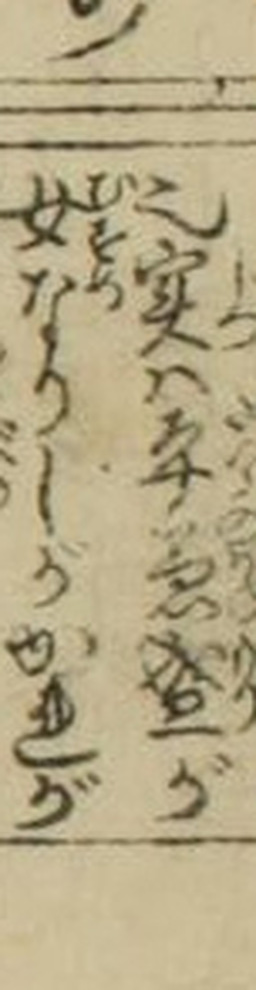女なりしがかれが
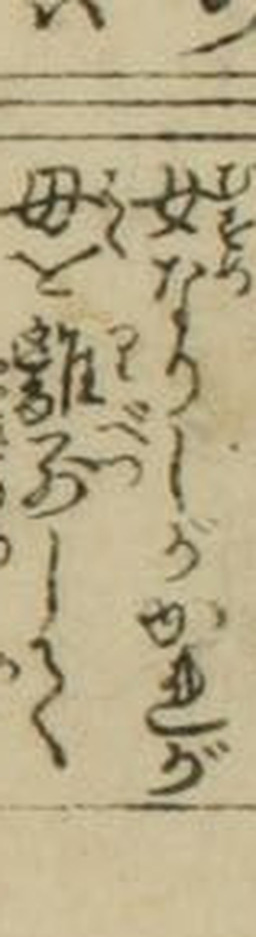母を離別して
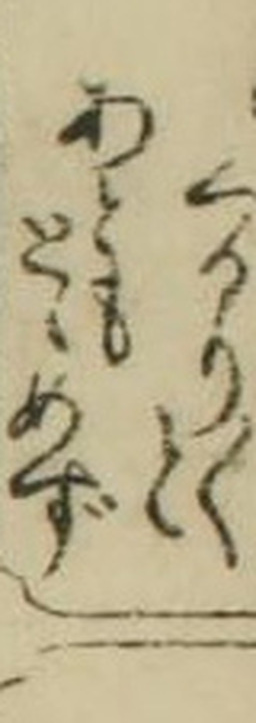とゝめず
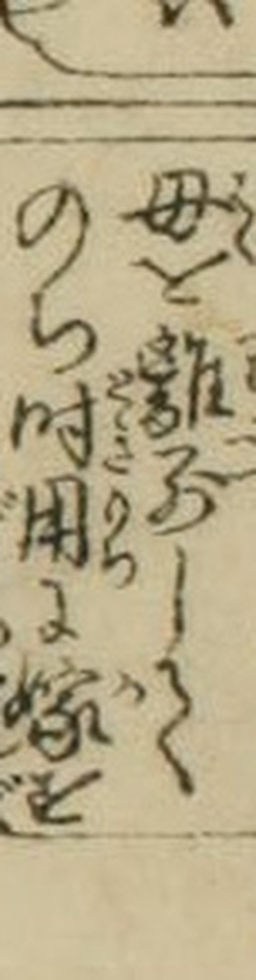のち時用に嫁す
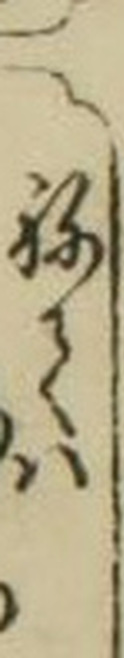ねては
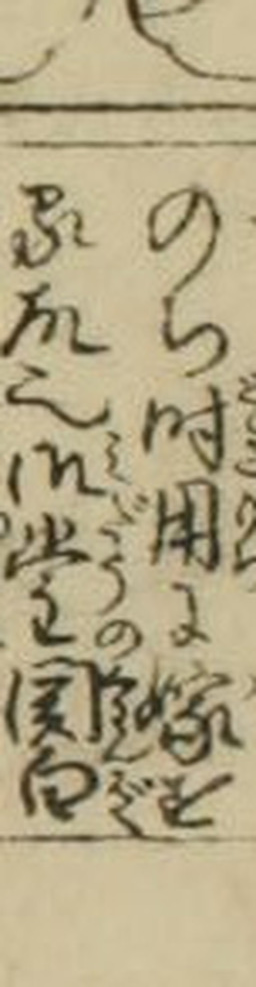る故也御堂関白
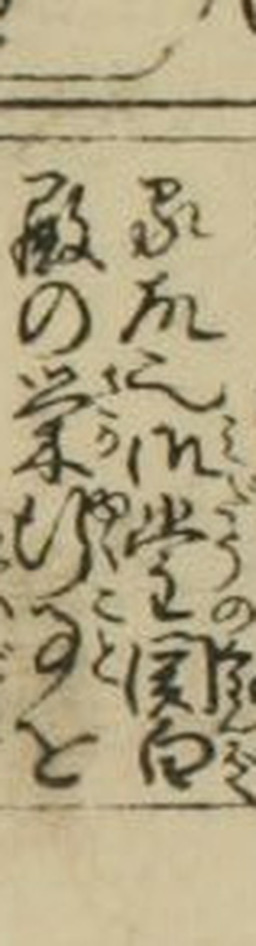殿の栄行事を
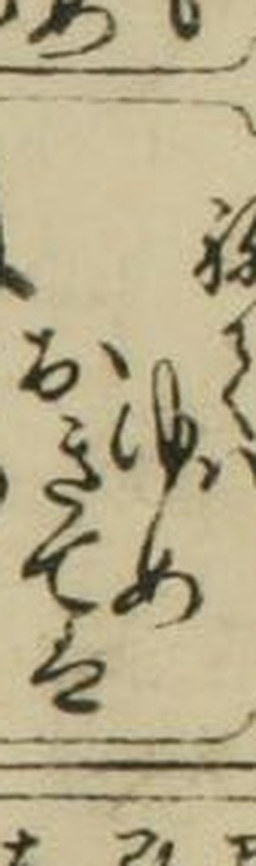おきては
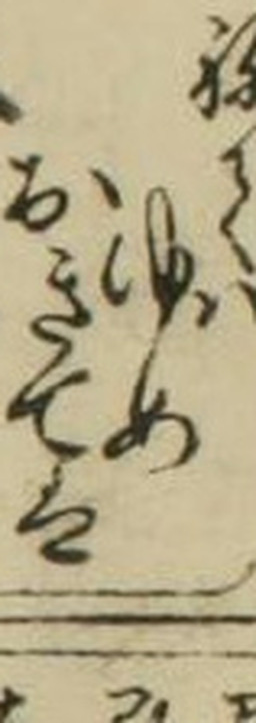おきては
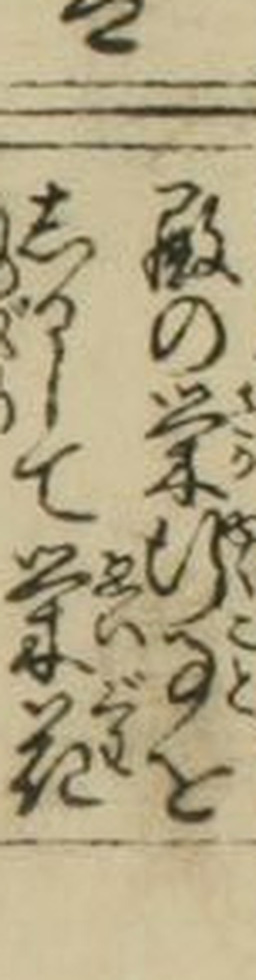しるして栄花
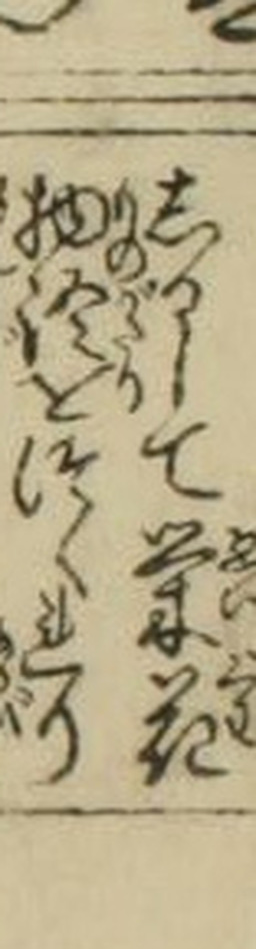物語をつくれり
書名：女源氏教訓鑑
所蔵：東京学芸大学附属図書館
